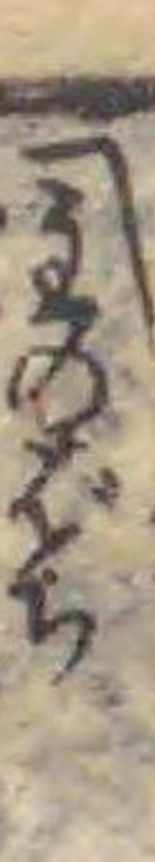〽主のばち
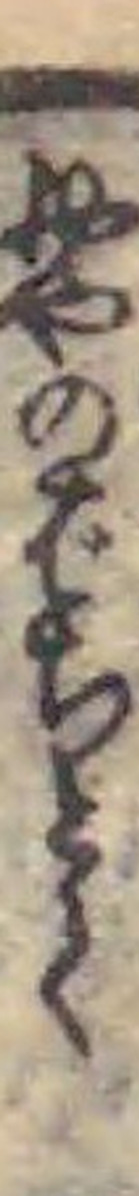おやのばちとて
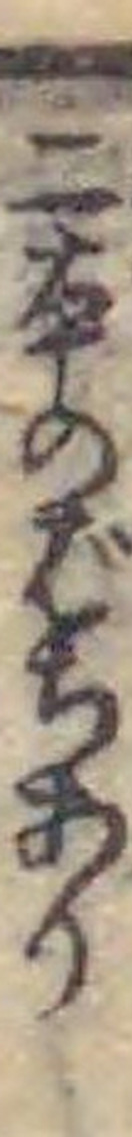二本のばちあり
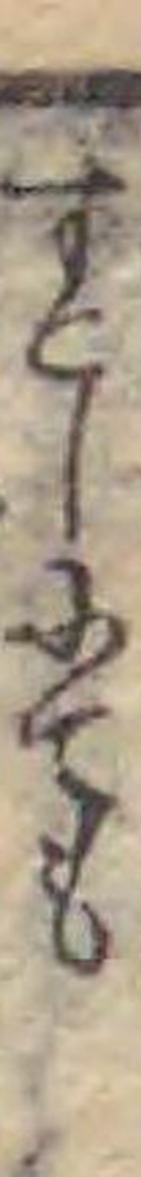すこしにても
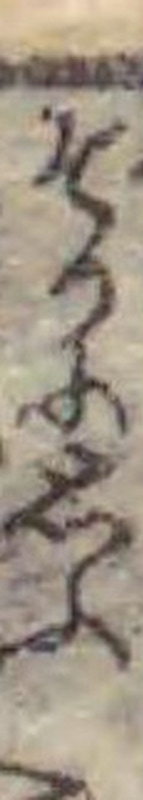そかに思ふ
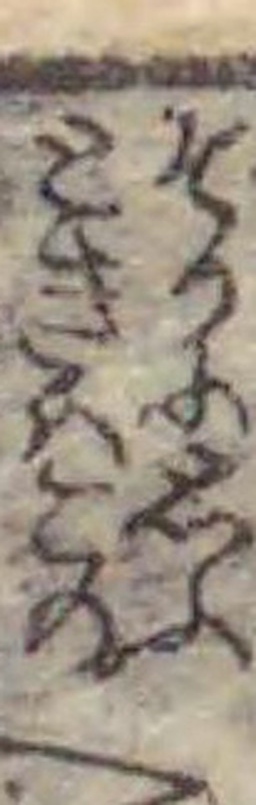ときはこの
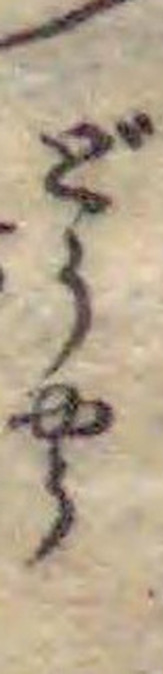どうやら
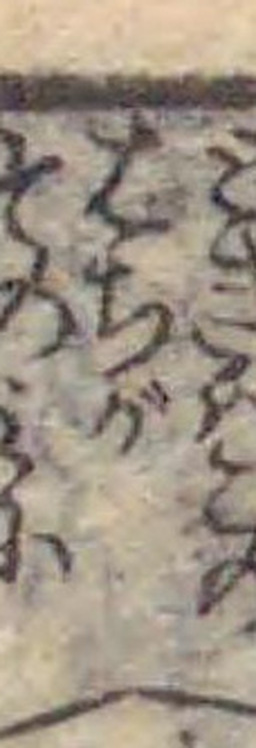はちが
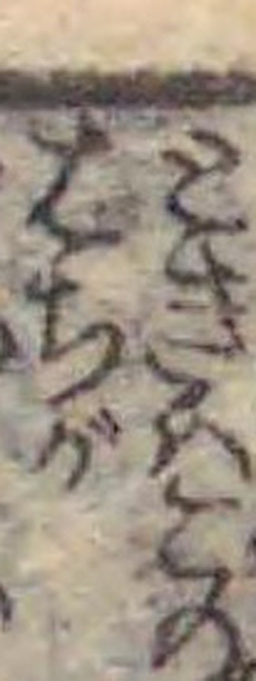はちが
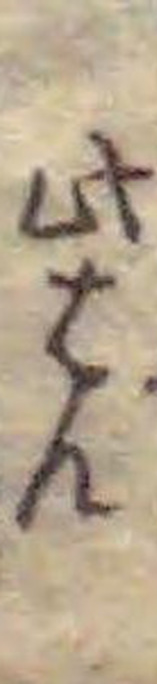此はん
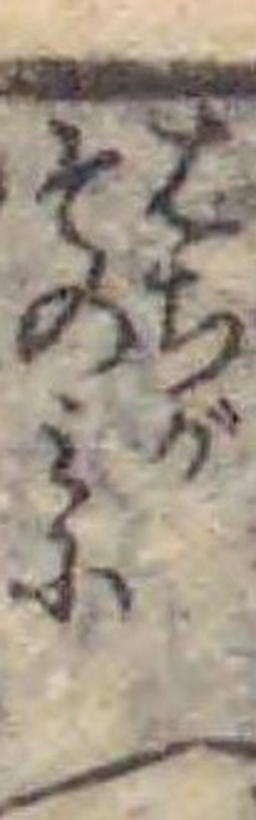そのみに
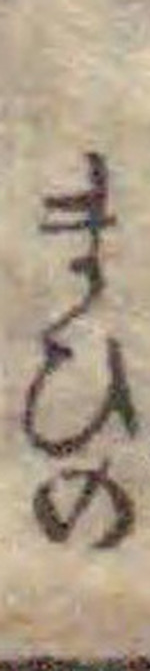まひの
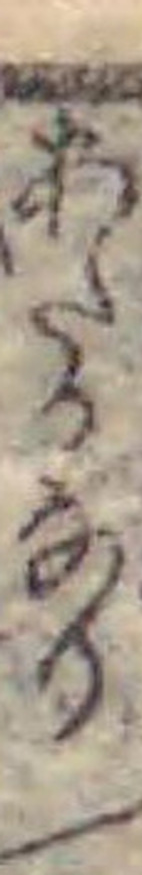あたるなり
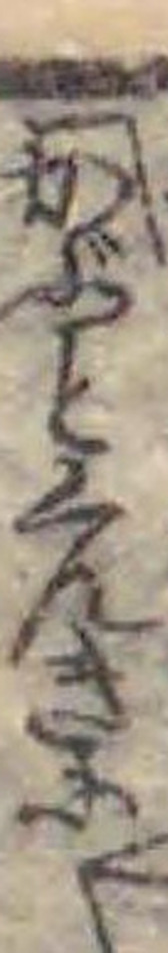〽かぶとくんきに
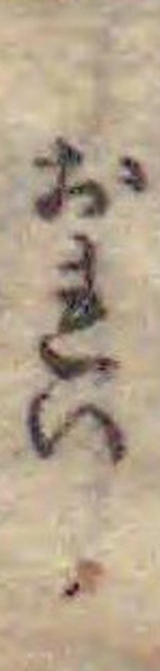おれい
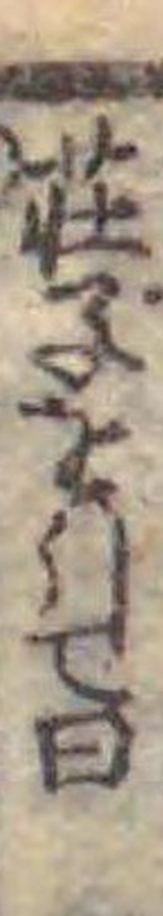荘子を引て曰
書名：身体開帳略縁起 : 3巻
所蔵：国立国会図書館 National Diet Library, JAPAN
